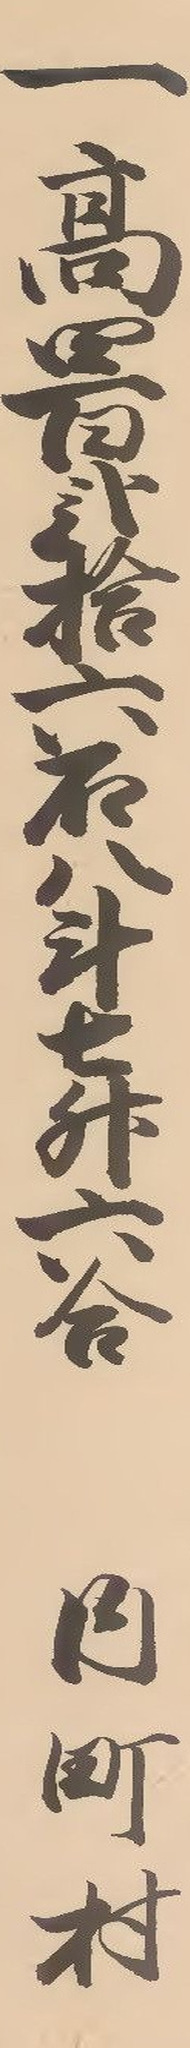一高四百弐拾六石八斗七升六合内町村
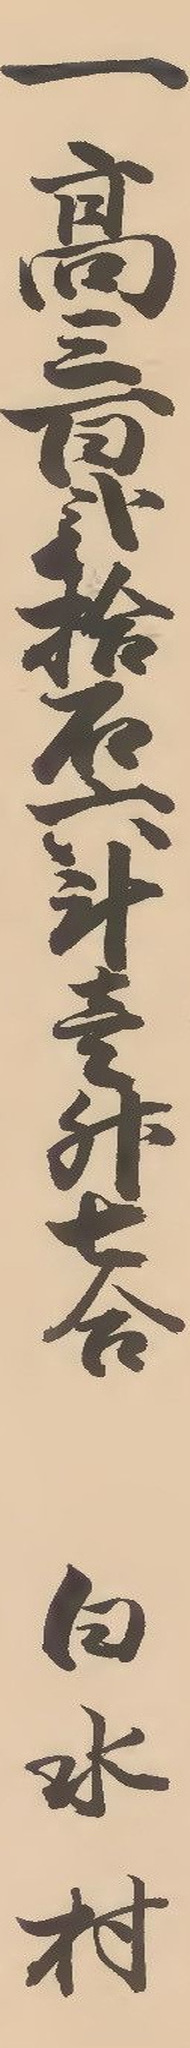一高三百弐拾石六斗壱升七合白水村
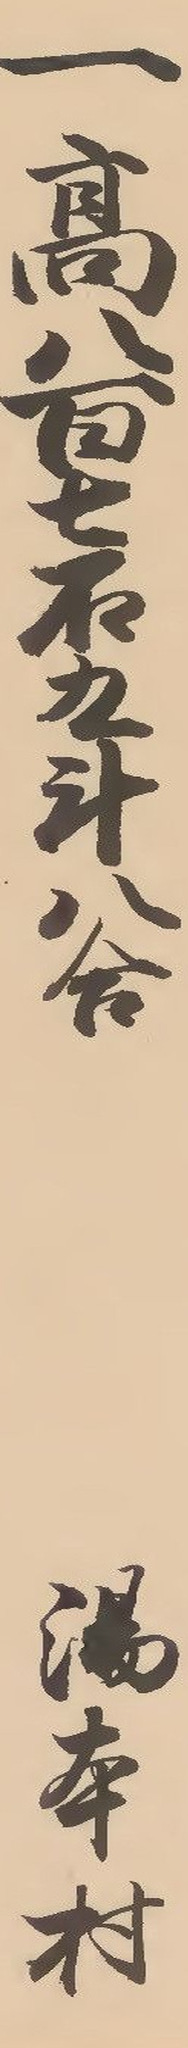一高八百七石九斗八合湯本村
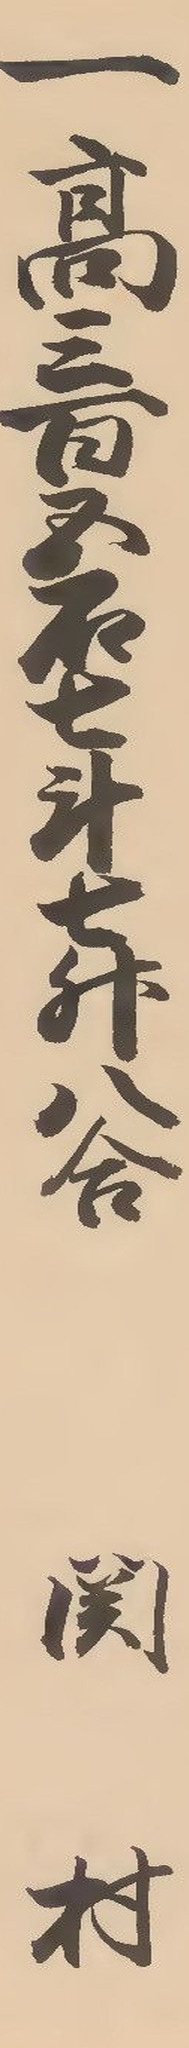一高三百五石七斗七升八合関村

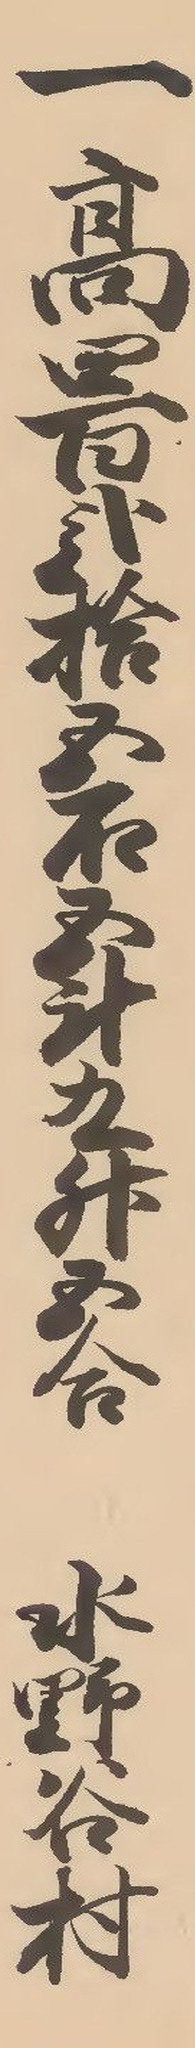一高四百弐拾五石五斗九升五合水野谷村
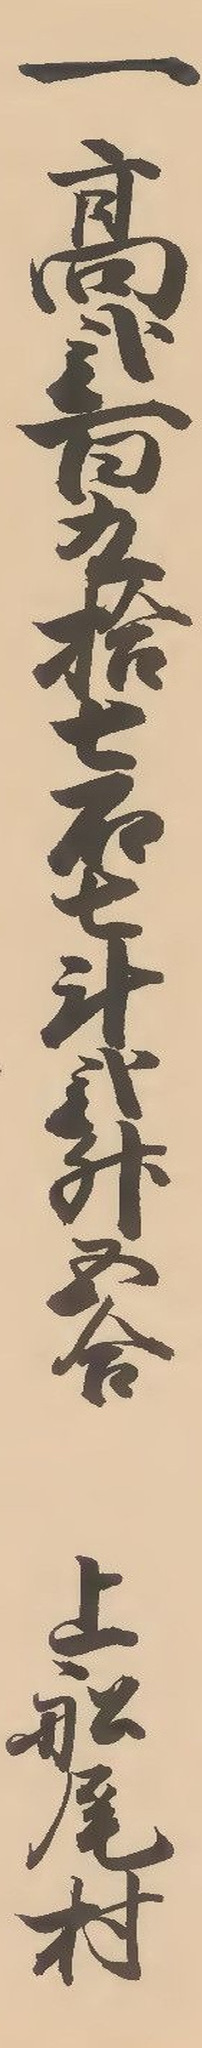一高弐百九拾七石七斗弐升五合上船尾村
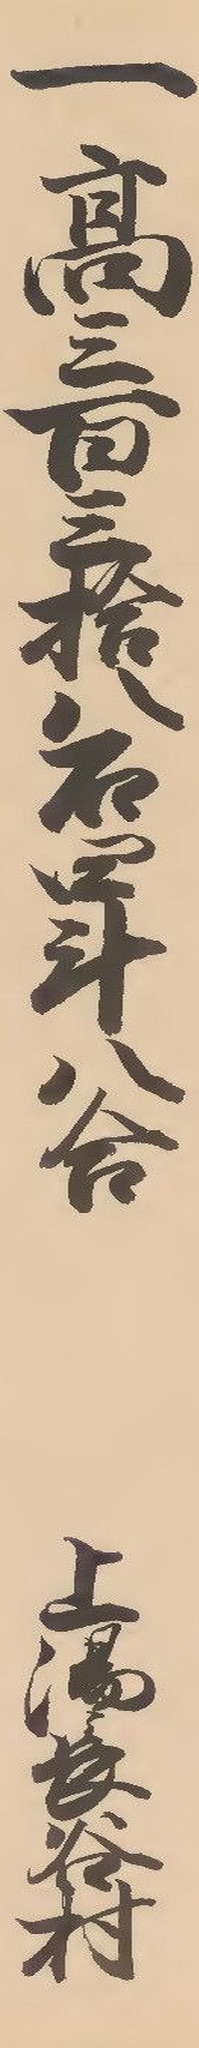一高三百三拾八石四斗八合上湯長谷村
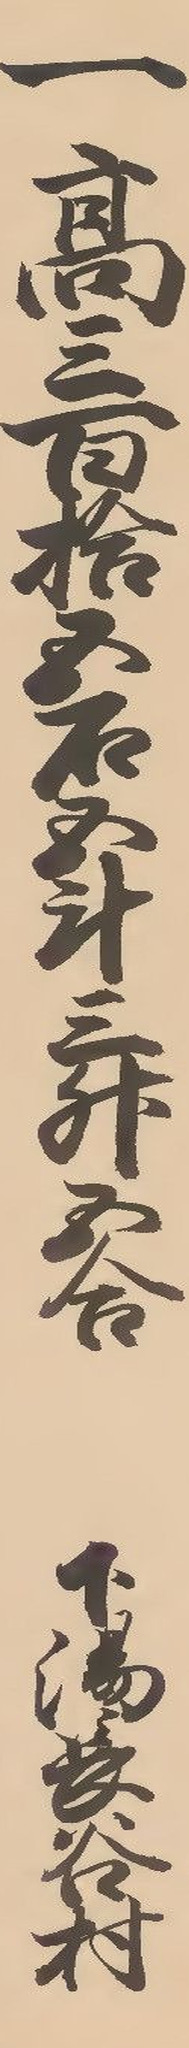一高三百拾五石五斗三升五合下湯長谷村
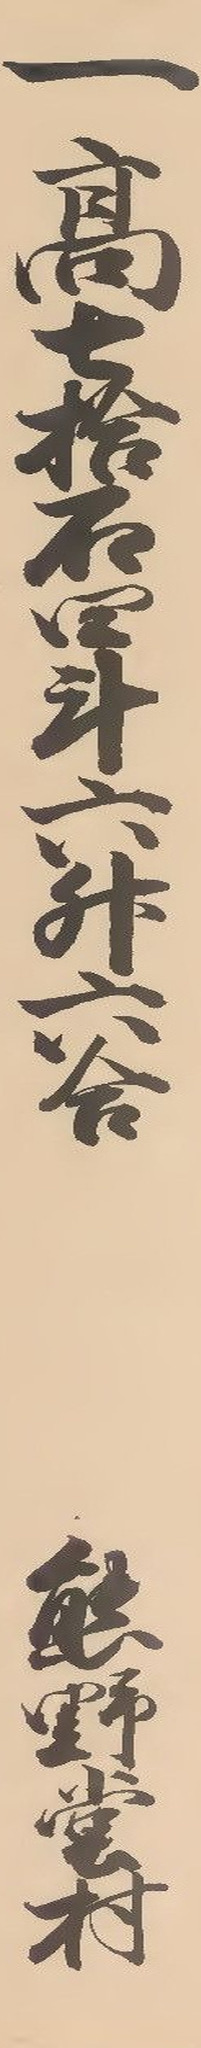一高七拾石四斗六升六合熊野堂村
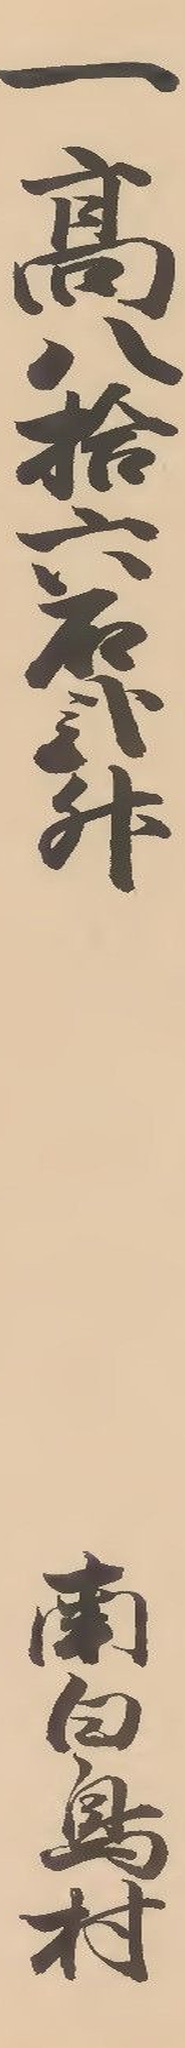一高八拾六石弐升南白鳥村
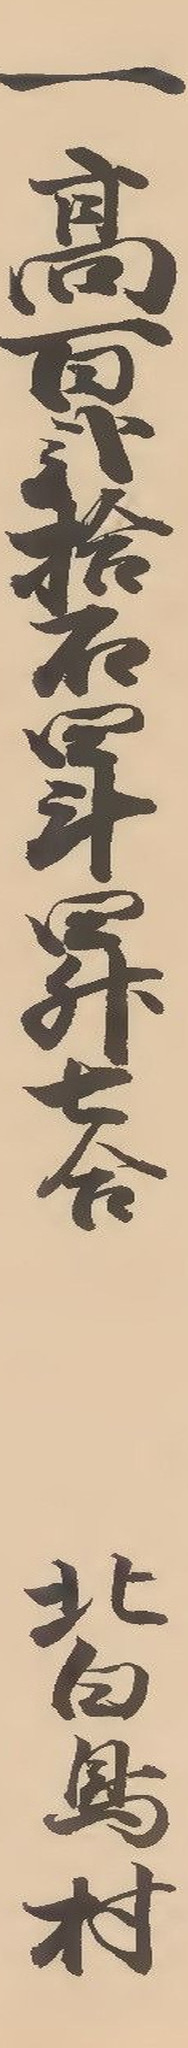一高百弐拾石四斗四升七合北白鳥村
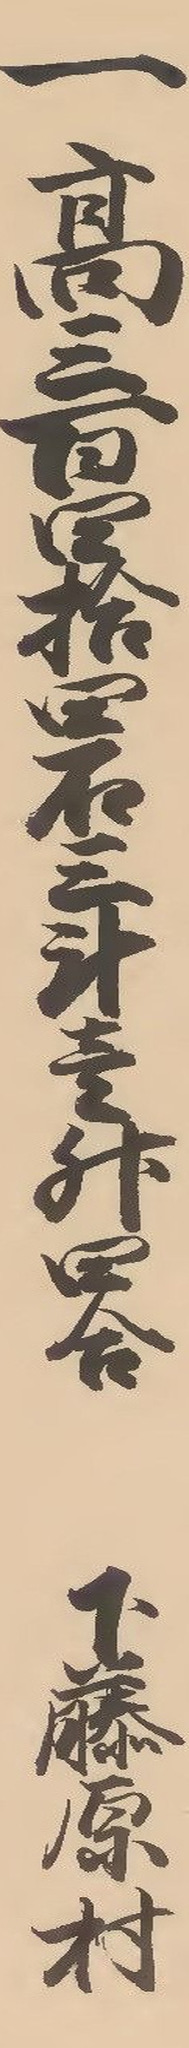一高三百四拾四石三斗壱升四合下藤原村

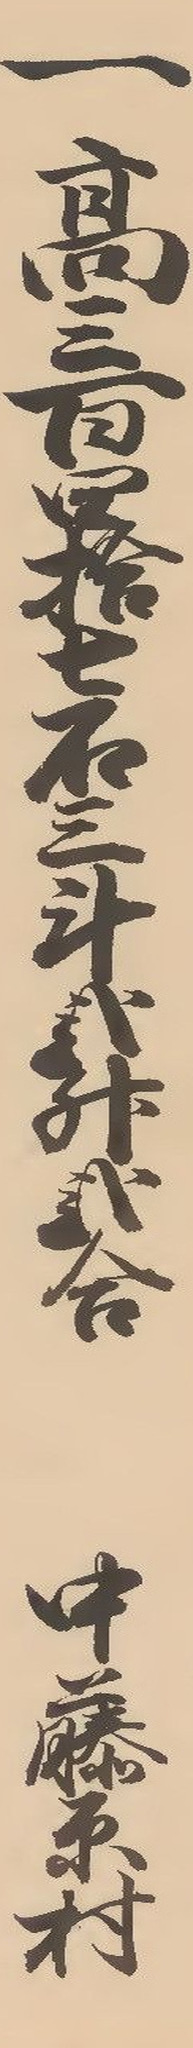一高三百四拾七石三斗弐升弐合中藤原村
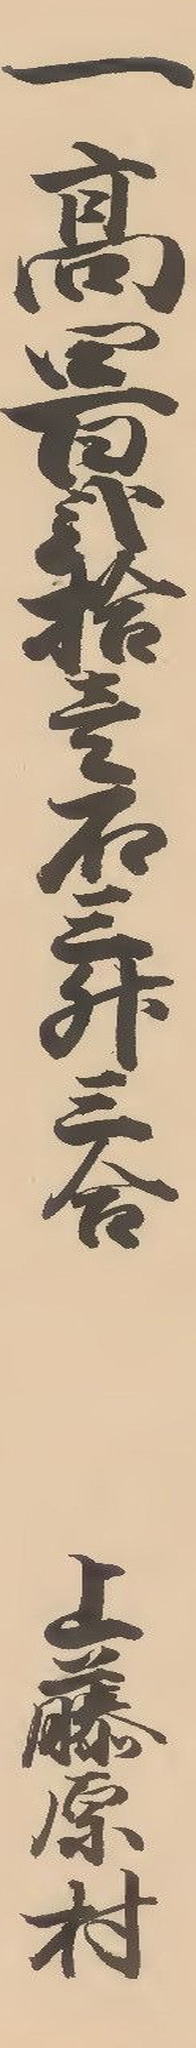一高四百弐拾壱石三升三合上藤原村
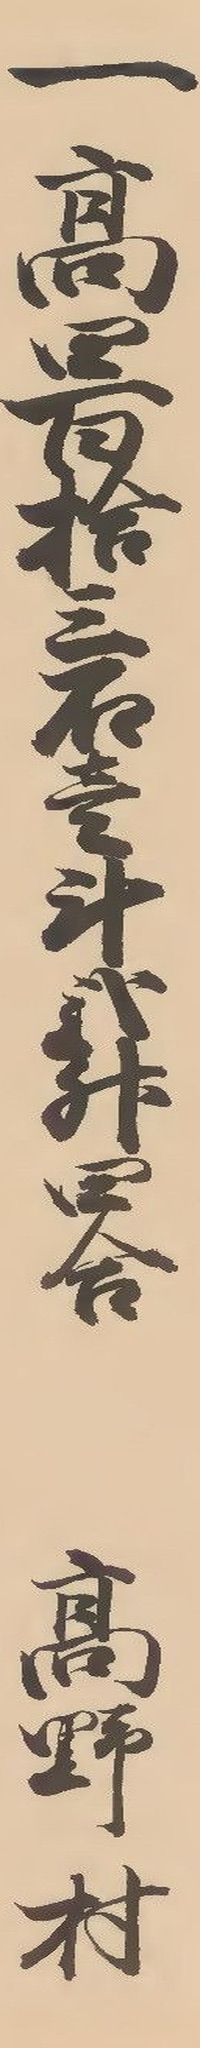一高四百拾三石壱斗弐升四合高野村
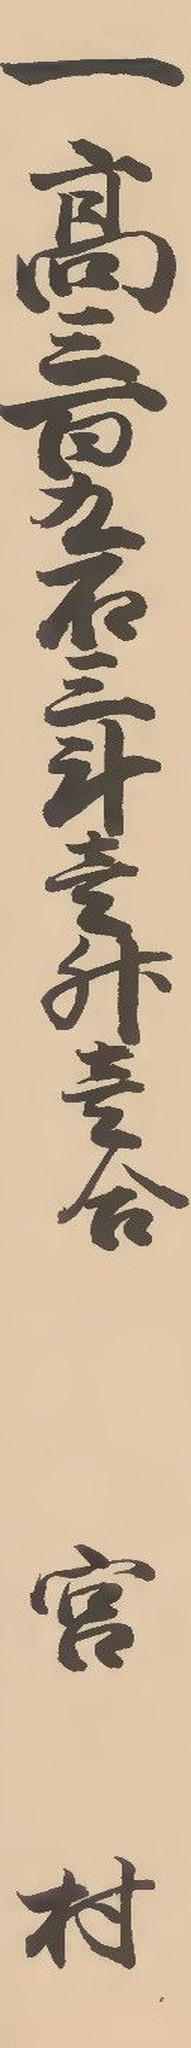一高三百九石三斗壱升壱合宮村
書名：陸奥国郷帳　３
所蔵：国立公文書館 National Archives of Japan
